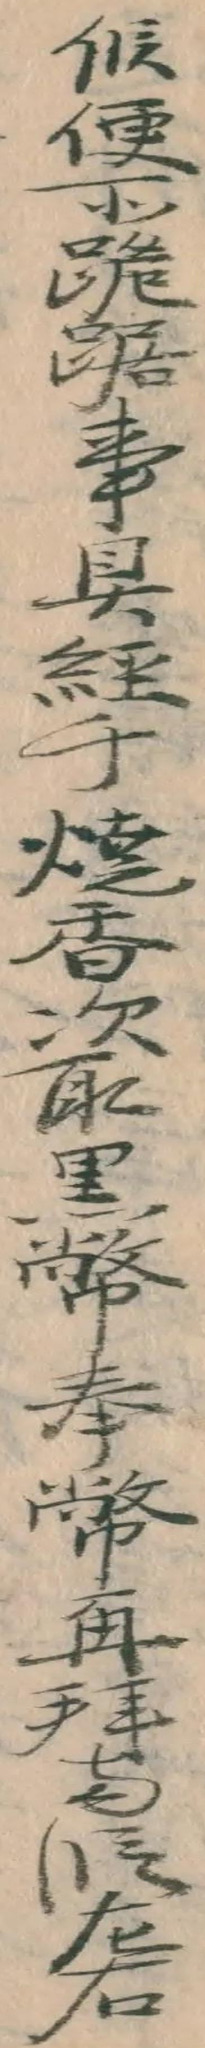候便所跪踞事具経千焼香次取黒幣奉幣再拝両段左右
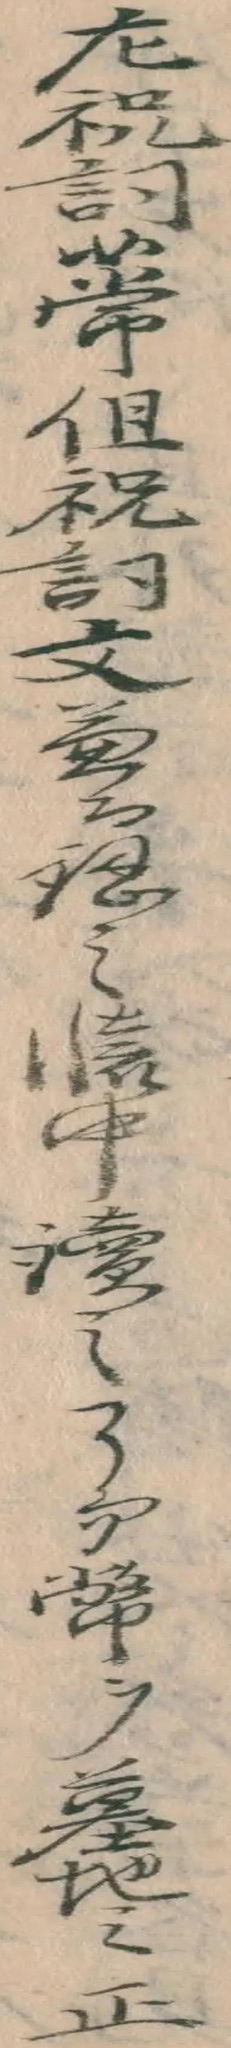左祝詞如常但祝詞文兼而認之懐中讀之了而幣ヲ墓地之正
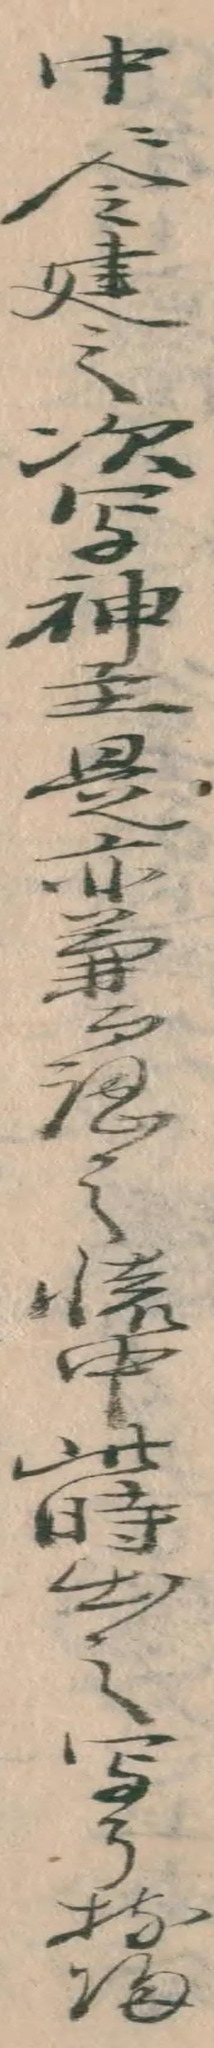中ニ令建之次写神主是亦兼而認之懐中此時出之写了持帰
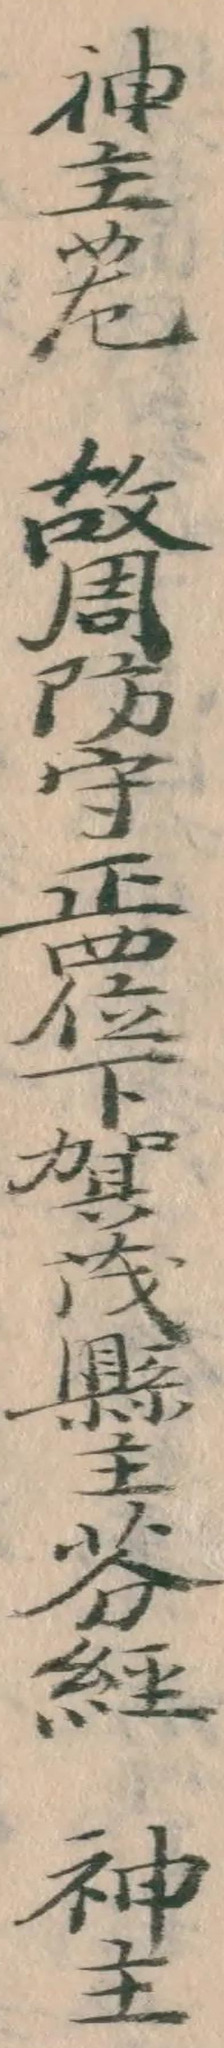神主如左故周防守正四位下賀茂県縣主芬経神主
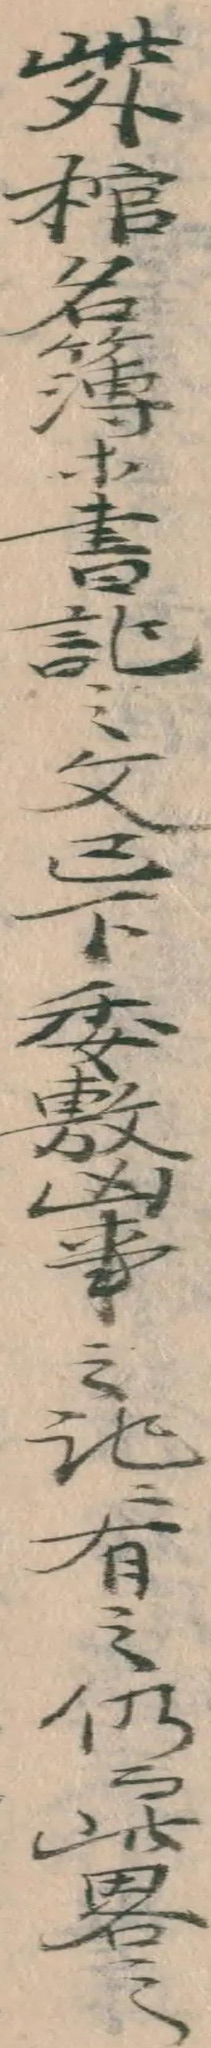此外棺名薄等書記之文已下委敷凶事之記ニ有之仍而此畧也
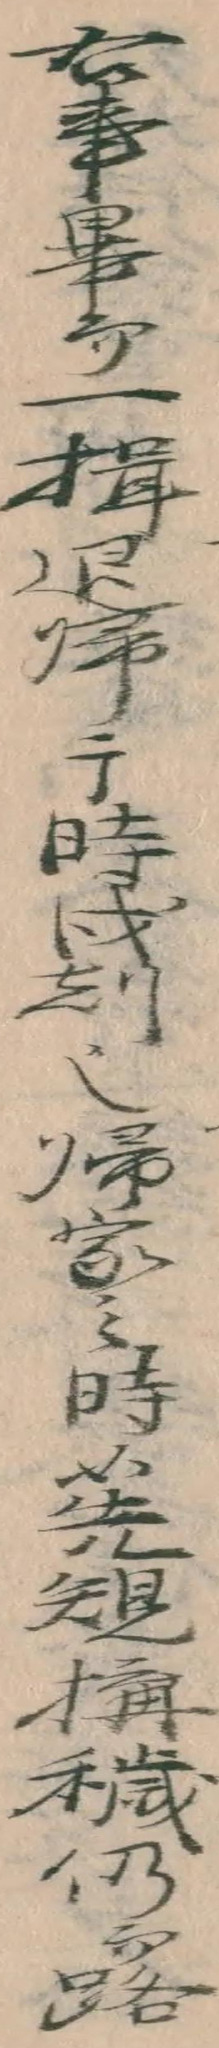右事畢而一揖退帰于時戌刻也帰家之時如先規構穢仍而路
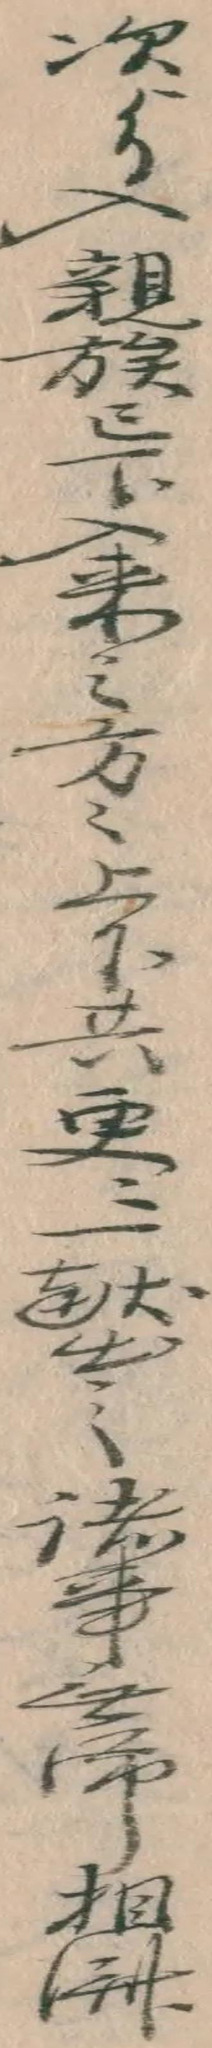次より入親族已下入来之方々上下共更ニ一献出之諸事無滞相済
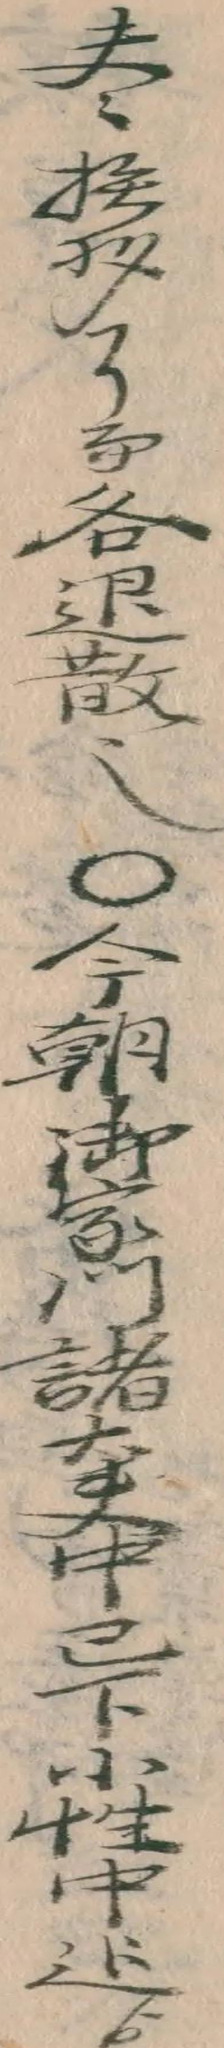夫々挨拶了而各退散也○今朝御家門諸大夫中已下小性中迄ゟ
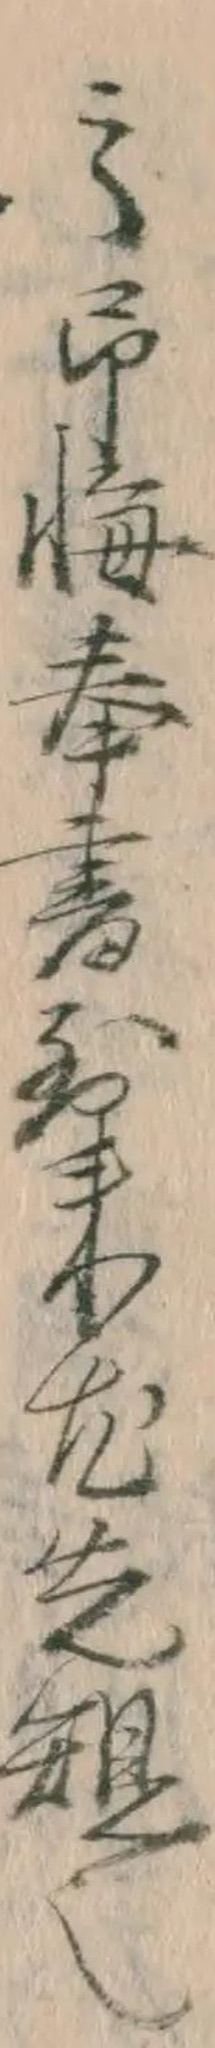之弔悔奉書到来尤先規也
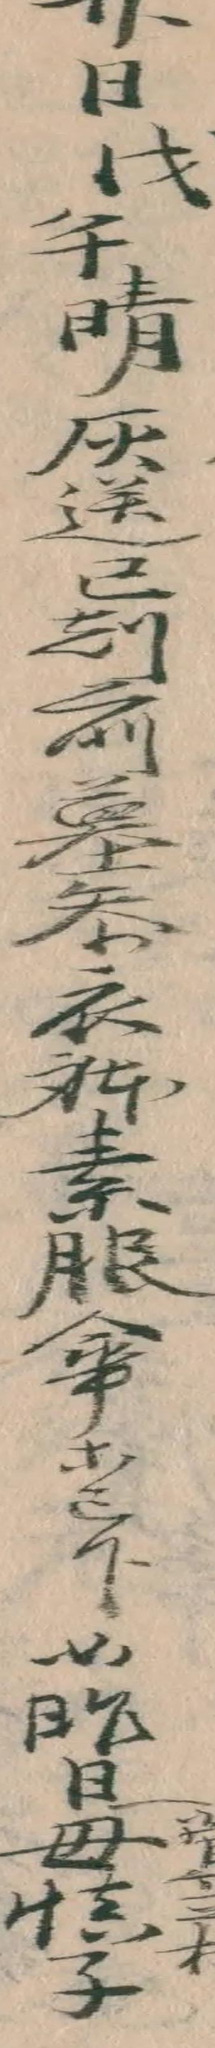廿日戊午晴灰送巳刻前墓参衣躰素服傘等已下如昨日菅笠杖母慎子
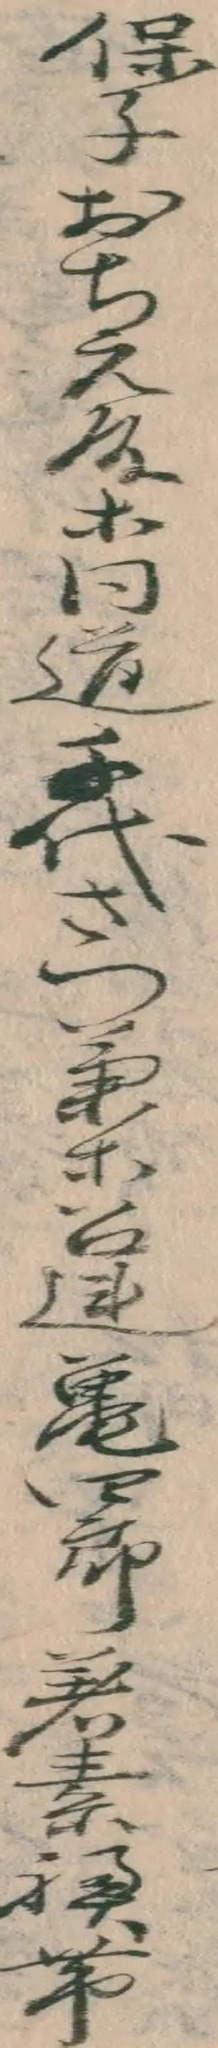保子おちえ殿等同道千代さつま等召連亀四郎着素襖帯
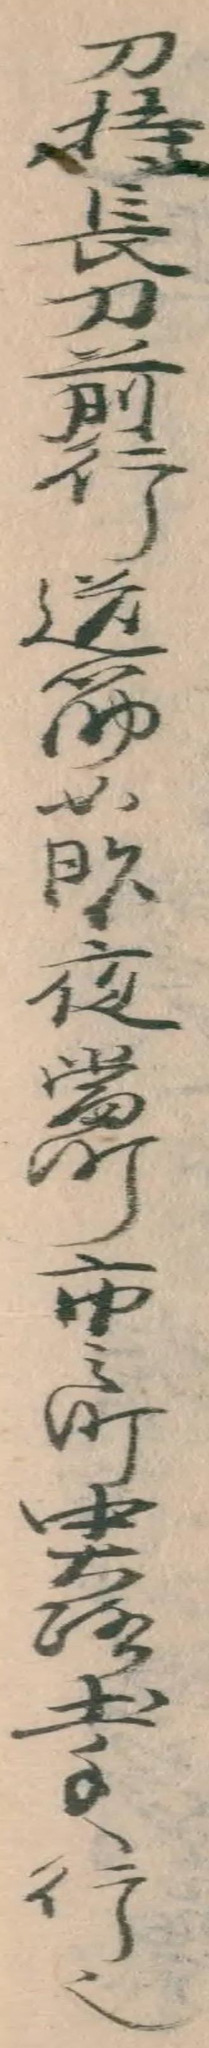刀持長刀前行道筋如昨夜當町市之町中大路土手へ行也
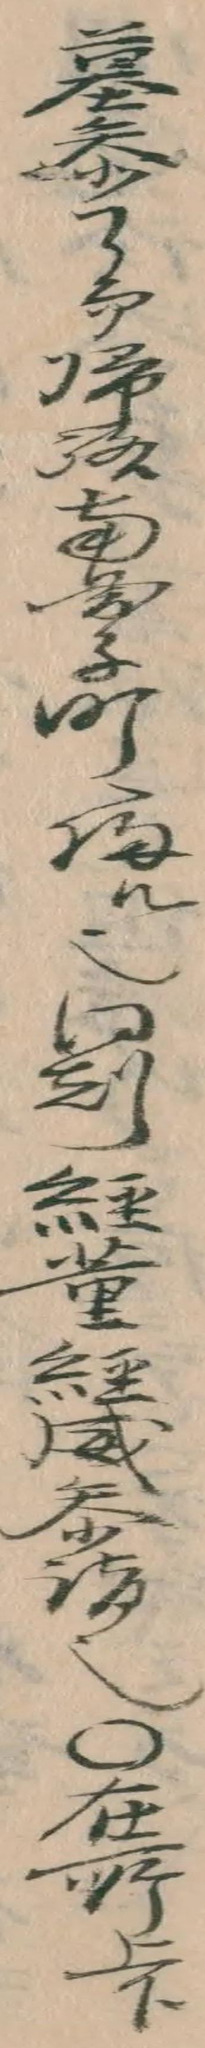墓参了而帰路南図子町へ帰ル也同刻経董経威参詣也○在所上下
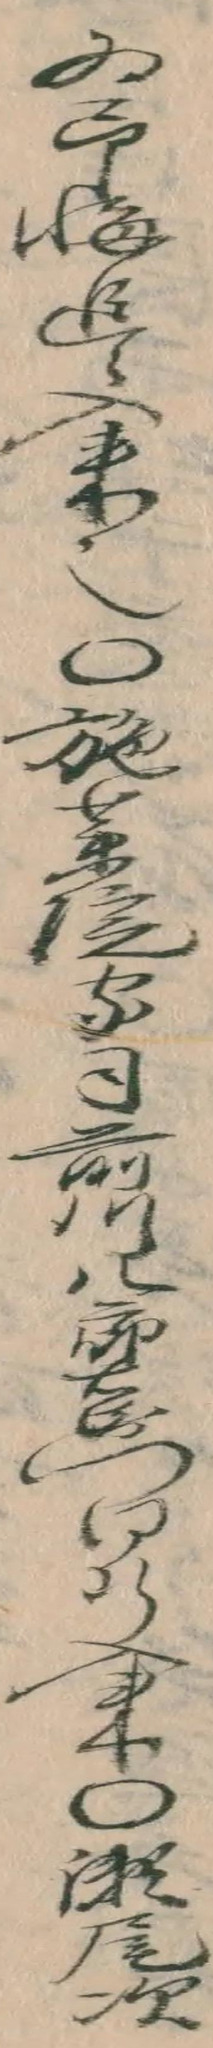為弔悔追〻入来也〇施薬院家司前川八郎右衛門同断入来〇瀬尾次
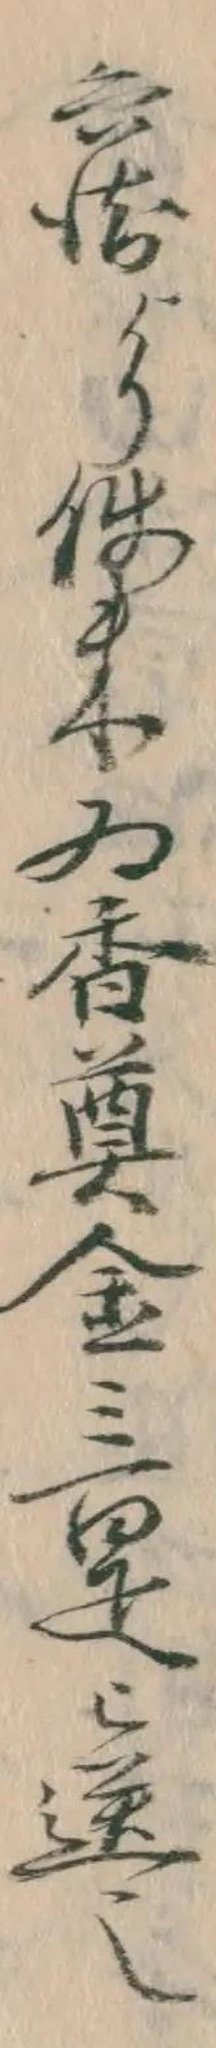兵衛より使来為香奠金三百疋被送也
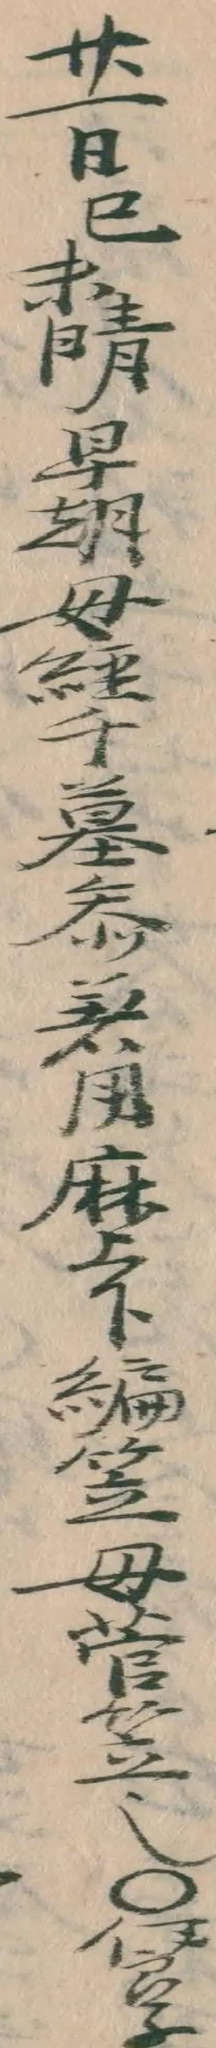廿一日己未晴早朝母経千墓参着用麻上下編笠母菅笠也○伊豆
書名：賀茂社記録. 第65冊
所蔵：国立国会図書館 National Diet Library, JAPAN
